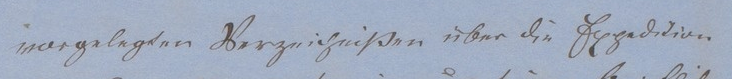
vorgelegten Verzeichnißen über die Expedition
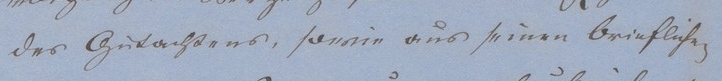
des Gutachtens, sowie aus seinen brieflichen
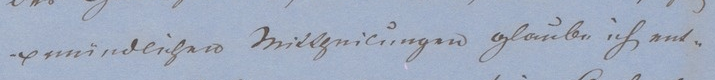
& mündlichen Mittheilungen glaube ich ent-
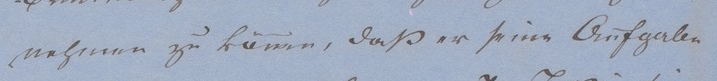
nehmen zu können, daß er seine Aufgabe
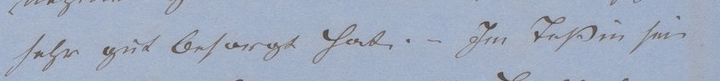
sehr gut besorgt hat. – Im Teßin sei
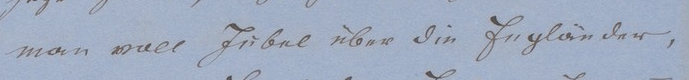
man voll Jubel über die Engländer,
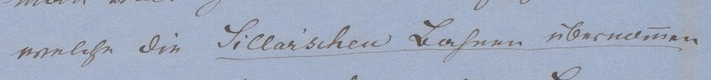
welche die Sillar'schen Bahnen übernommen
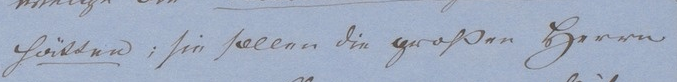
hätten; sie sollen die großen Herrn
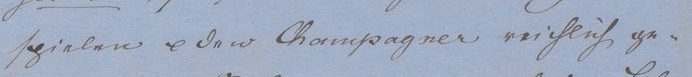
spielen & den Champagner reichlich ge-
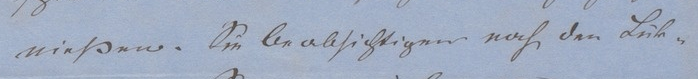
nießen. Sie beabsichtigen noch den Luk-
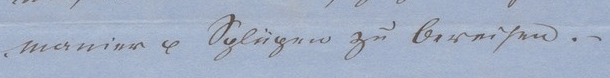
manier & Splügen zu bereisen. –
